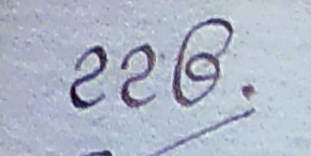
226.
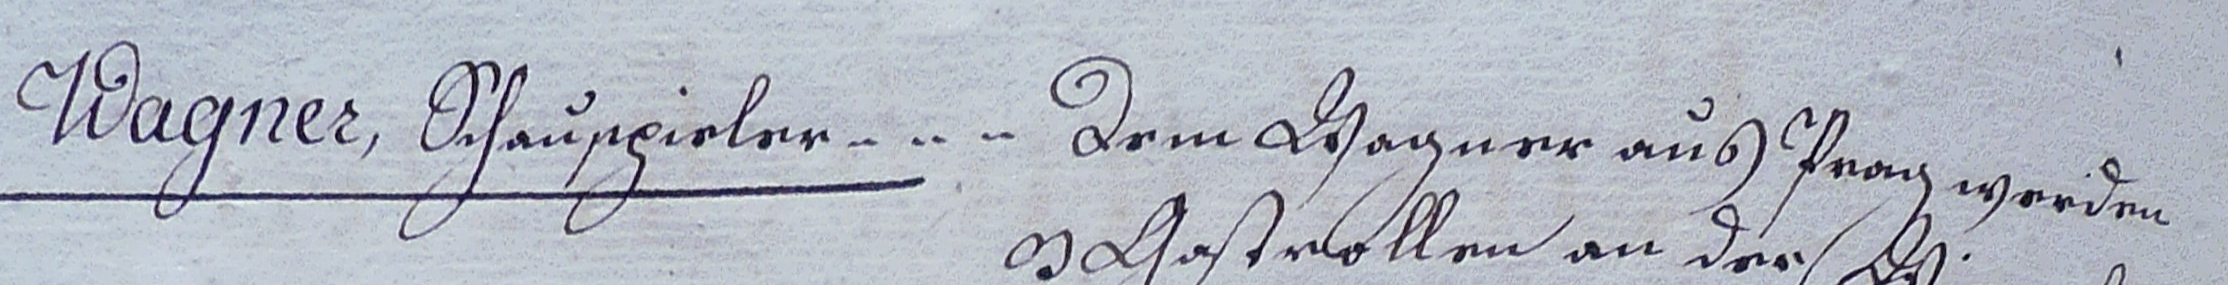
Wagner, Schauspieler .. .. .. Dem Wagner aus Prag werden
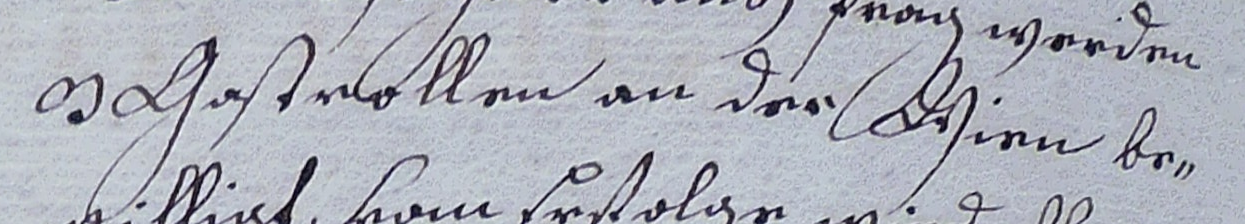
3 Gastrollen an der Wien be¬
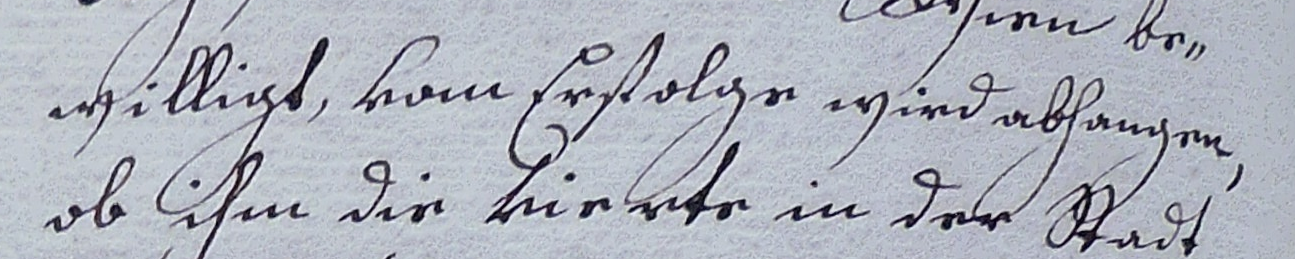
willigt, vom Erfolge wird abhangen,
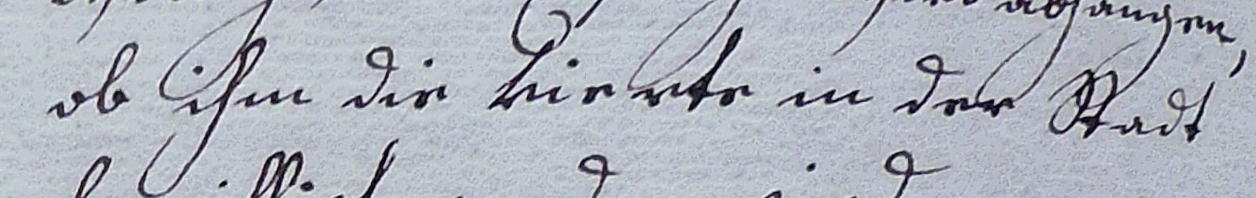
ob ihm die vierte in der Stadt
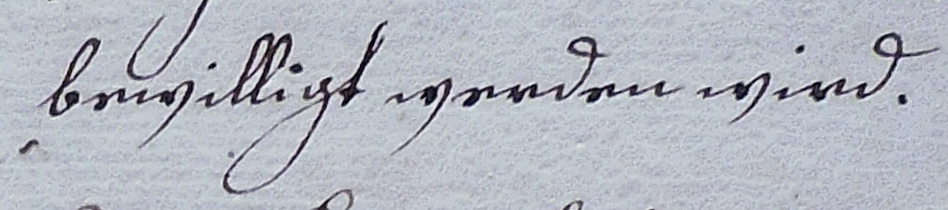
bewilligt werden wird.
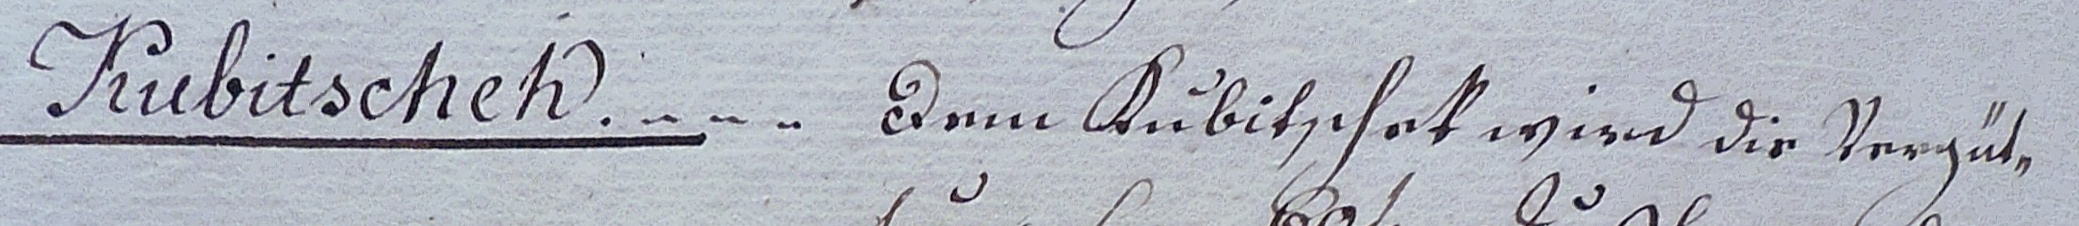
Kubitschek. .. .. .. Dem Kubitschek wird die Vergüt¬
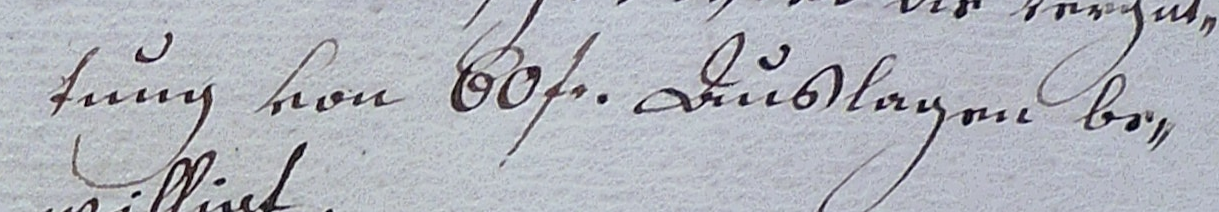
tung von 60fr. Auslagen be¬
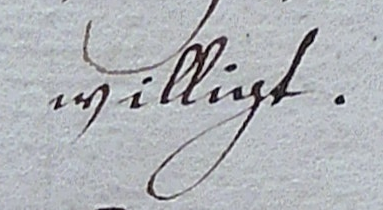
willigt.
